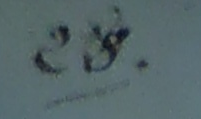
28.
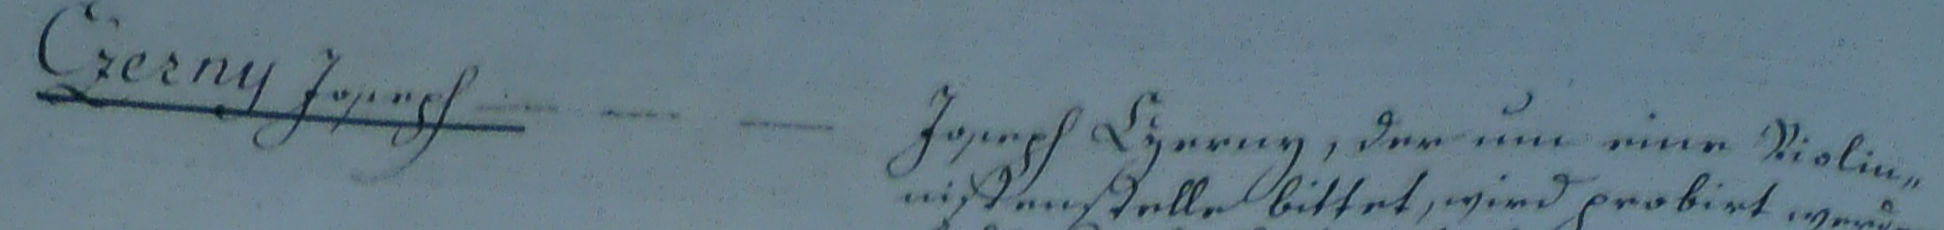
Czerny Joseph _ _ _ Joseph Czerny, der um eine Violin¬
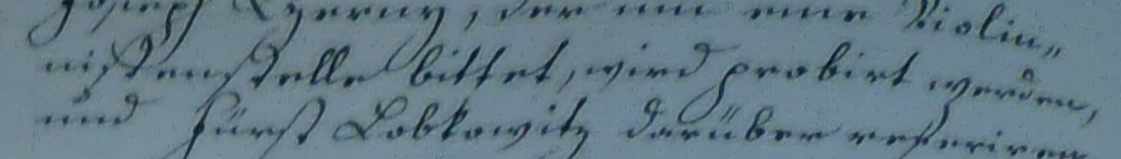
nistenstelle bittet, wird probirt werden,
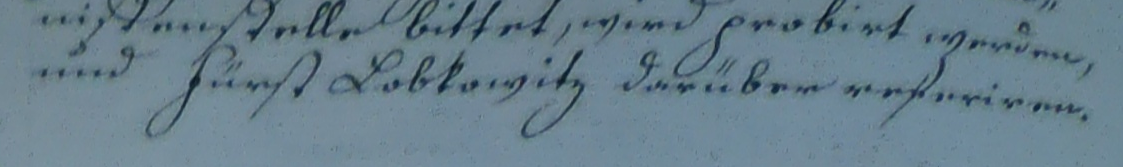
und Fürst Lobkowitz darüber referiren.
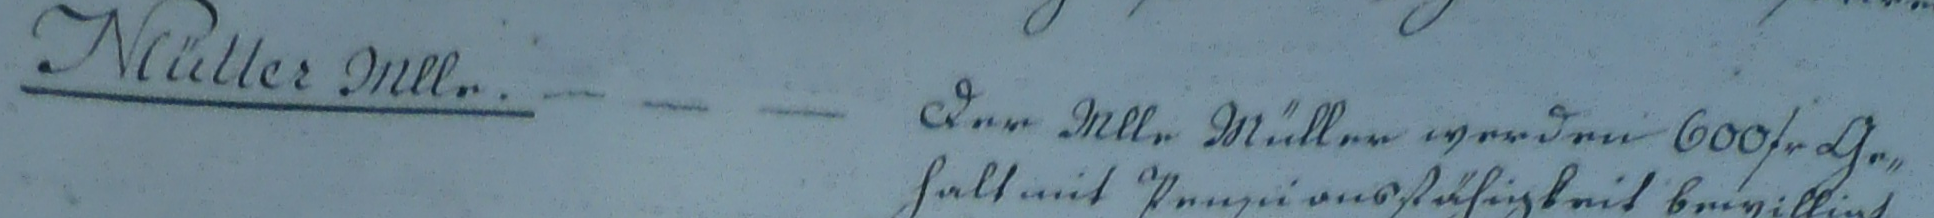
Müller Mlle. _ _ _ Der Mlle Müller werden 600fr Ge¬
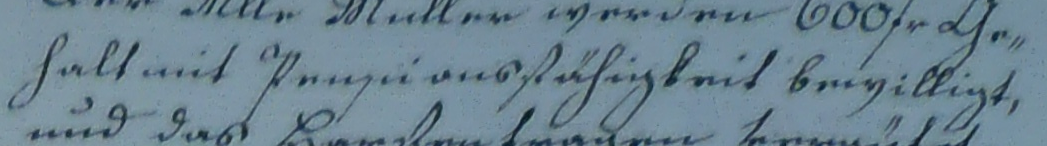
halt mit Pensionsfähigkeit bewilligt,
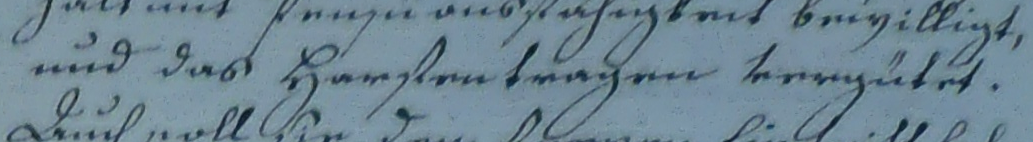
und das Harfentragen vergütet.
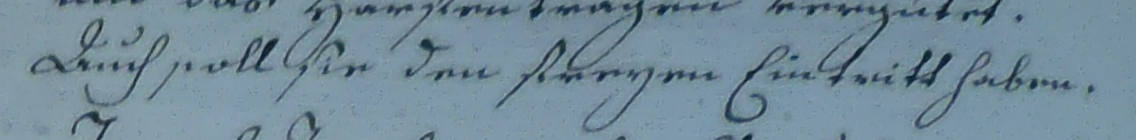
Auch soll sie den freyen Eintritt haben.
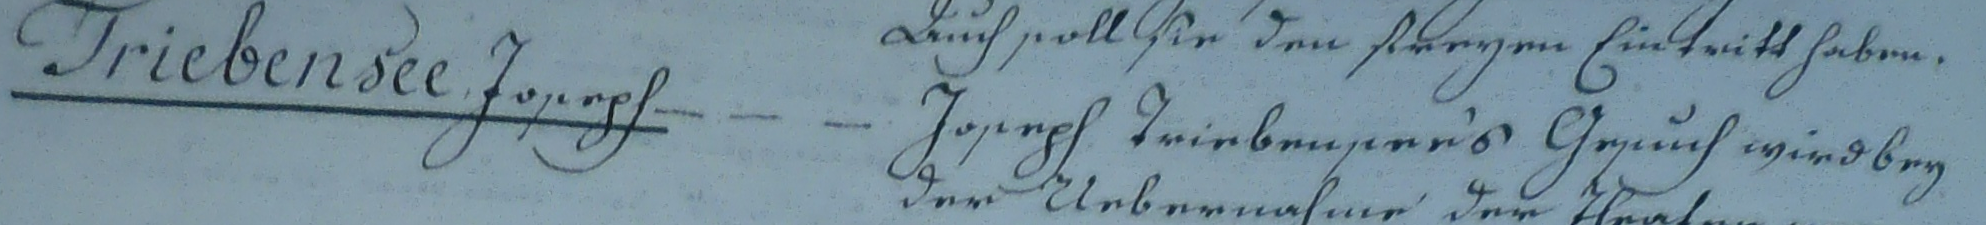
Triebensee, Joseph _ _ _ Joseph Triebensee’s Gesuch wird bey
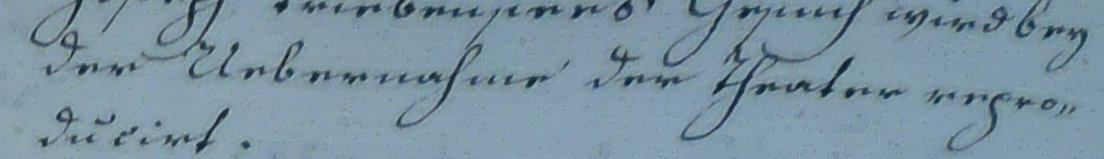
der Uebernahme der Theater repro¬
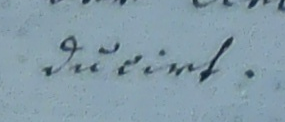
ducirt.
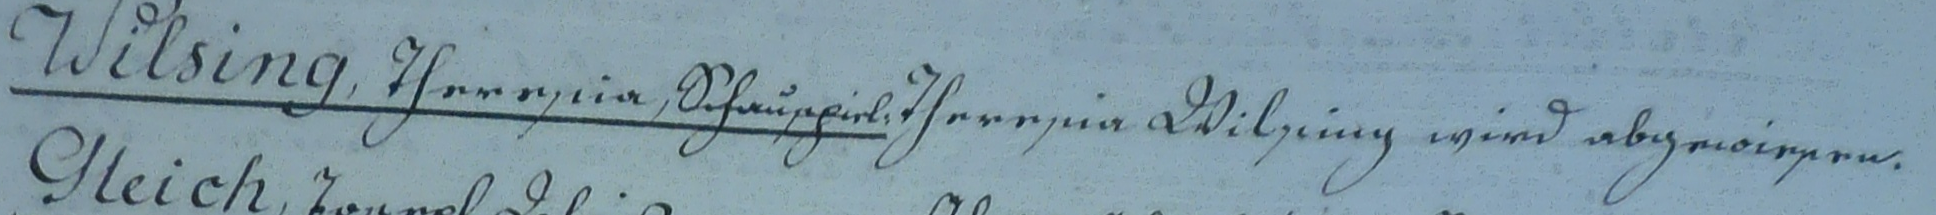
Wilsing, Theresia, Schauspiel: Theresia Wilsing wird abgewiesen.
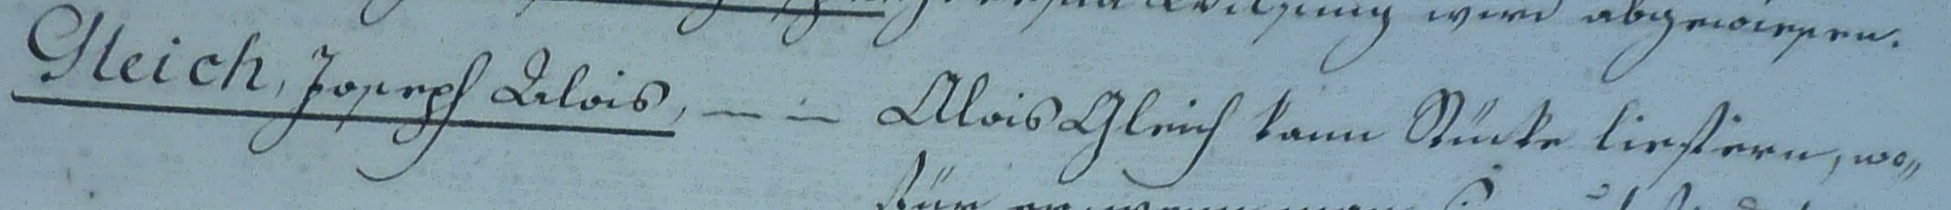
Gleich, Joseph Alois, _ _ Alois Gleich kann Stücke liefern, wo¬
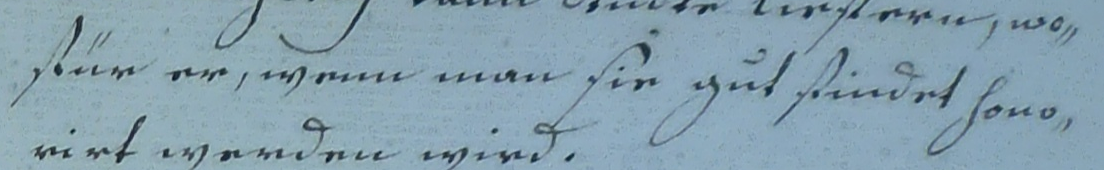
für er, wenn man sie gut findet hono¬
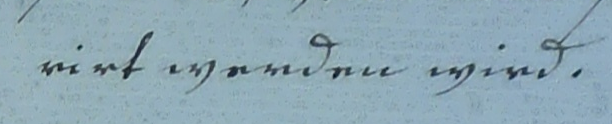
rirt werden wird.
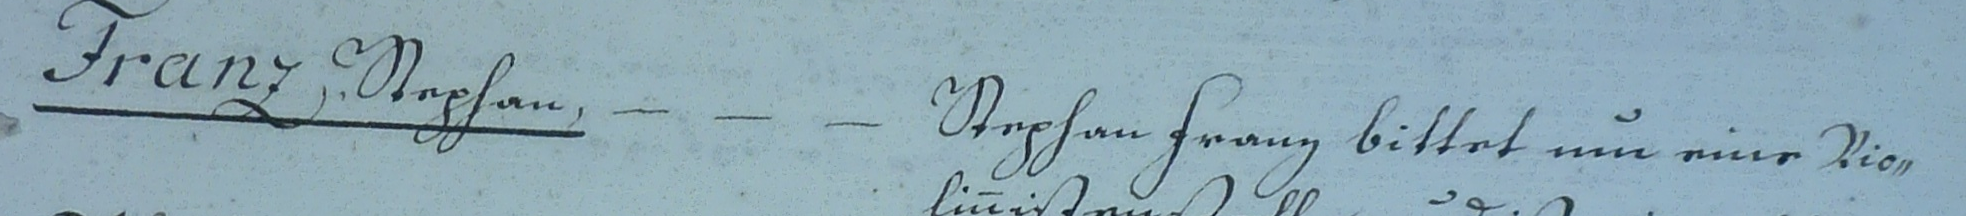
Franz, Stephan, _ _ _ Stephan Franz bittet um eine Vio¬
